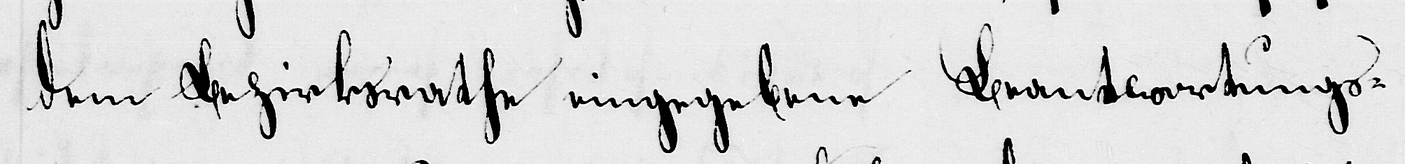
dem Bezirksrathe eingegebene Beantwortungs¬
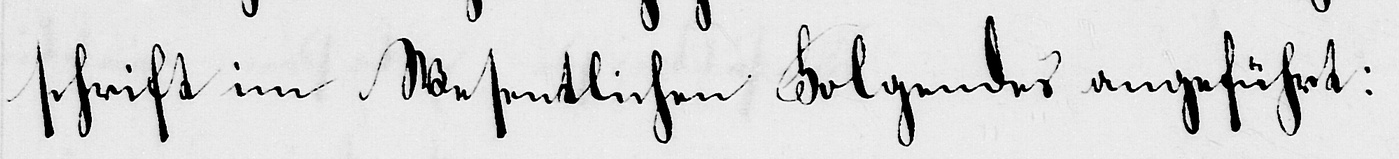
schrift im Wesentlichen Folgendes angeführt:
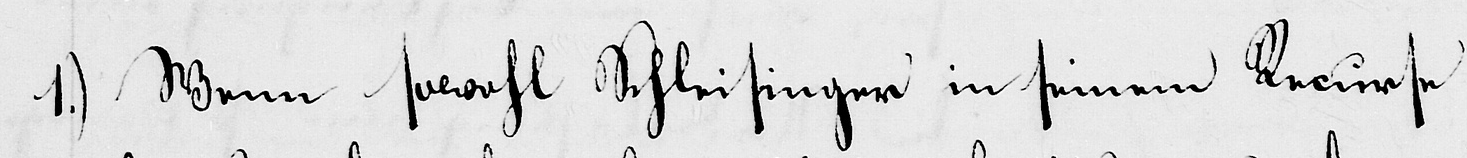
1.) Wenn sowohl Schleisinger in seinem Recurse
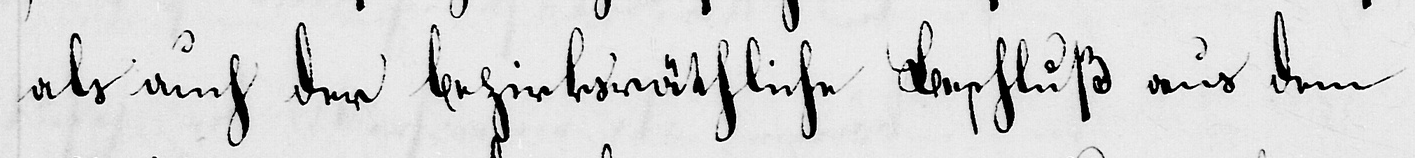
als auch der bezirksräthliche Beschluß aus dem
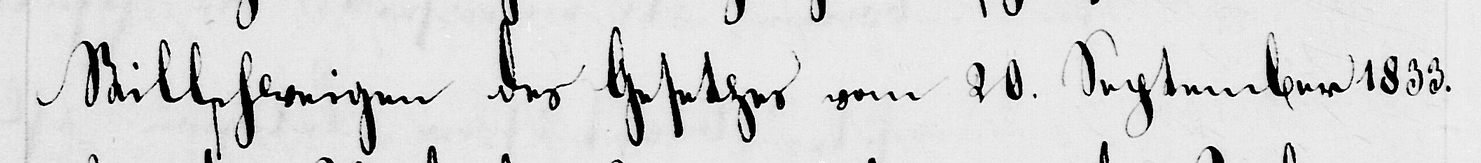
Stillschweigen des Gesetzes vom 20. September 1833.
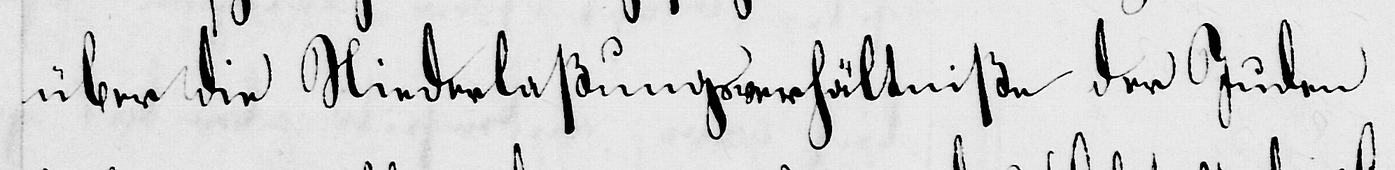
über die Niederlaßungsverhältniße der Juden
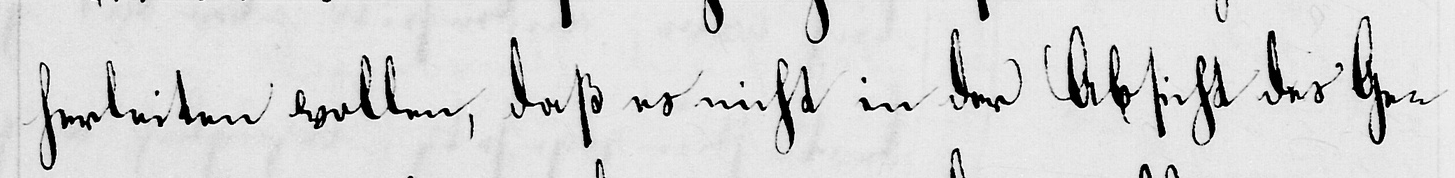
herleiten wollen, daß es nicht in der Absicht des Ge¬
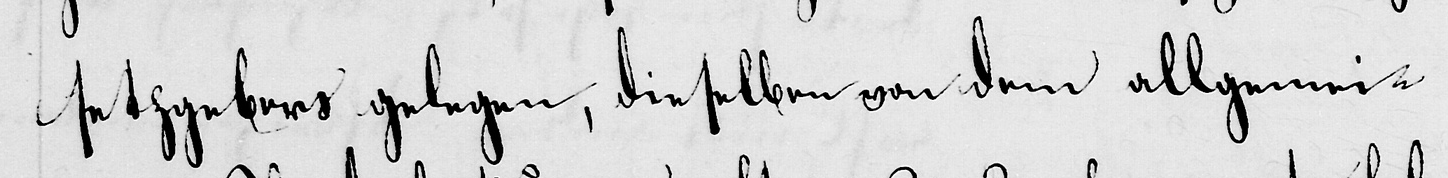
setzgebers gelegen, dieselben von dem allgemei¬
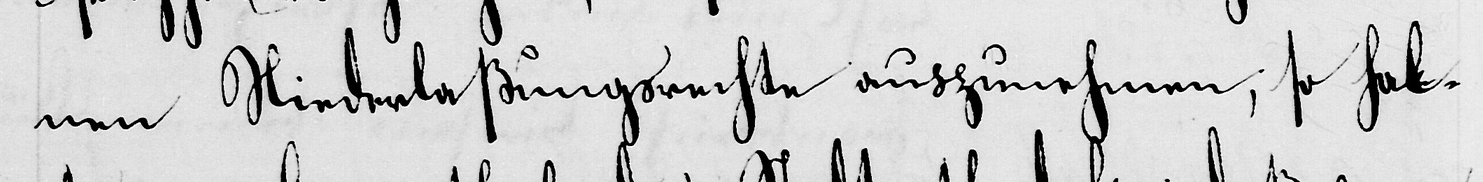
nen Niederlaßungsrechte auszunehmen, so hal¬
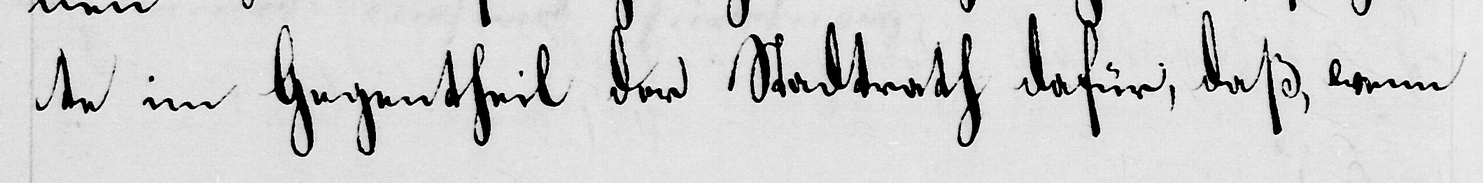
te im Gegentheil der Stadtrath dafür, daß, wenn
